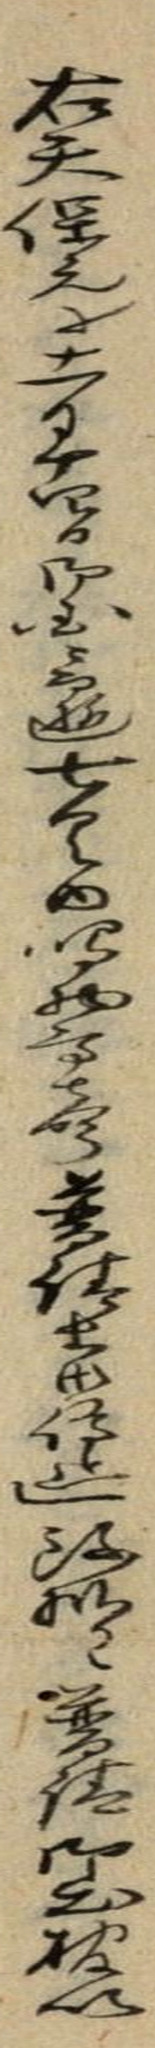右天保元刁十一月十四日御国にて逝七日之内鳴物高声普請等御停止致掛り候普請御出棺以
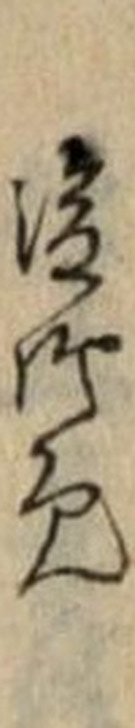後御免
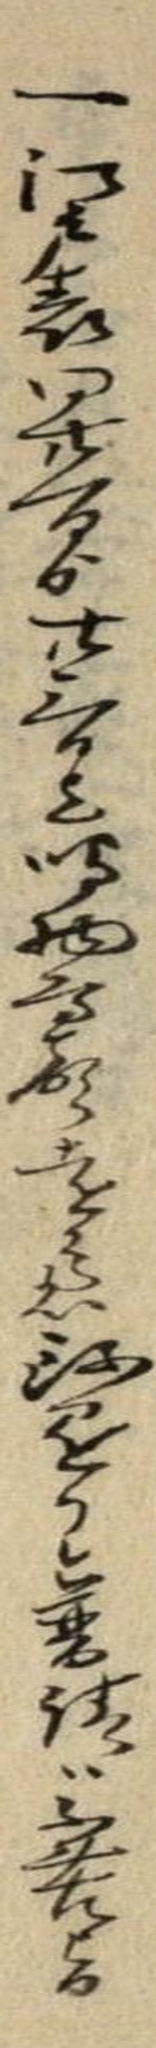一江戸表同廿一日ゟ廿三日迄鳴物高声遠慮致懸り候普請は不苦旨
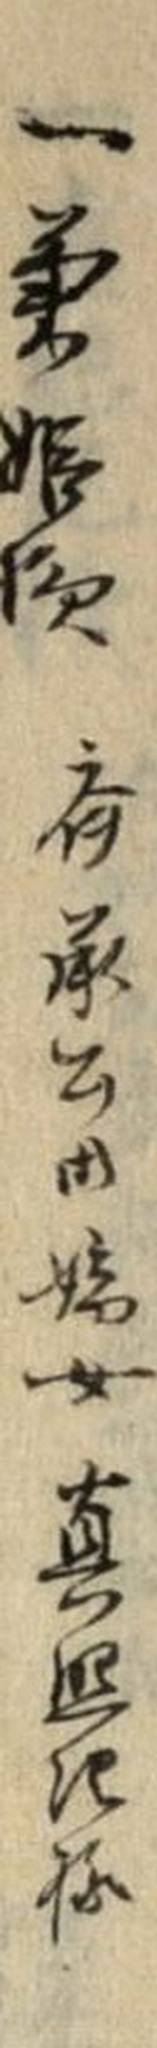一菊姫様斉承公御嫡女真照院様
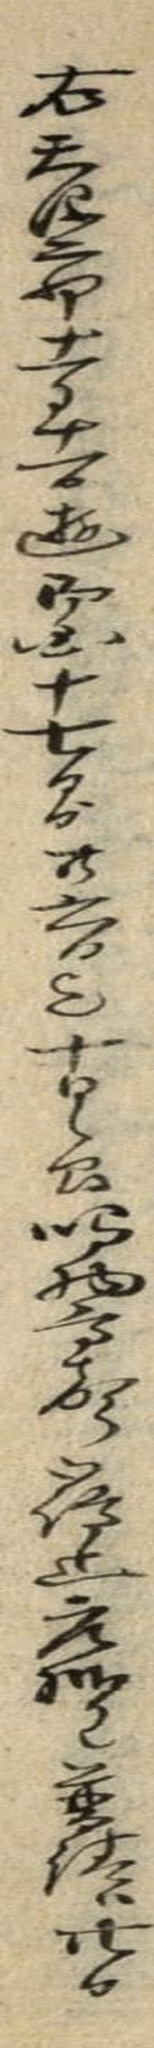右天保二卯十一月十一日逝御国十七日ゟ廿六日迄十日之間鳴物高声御停止取掛り候普請は廿日
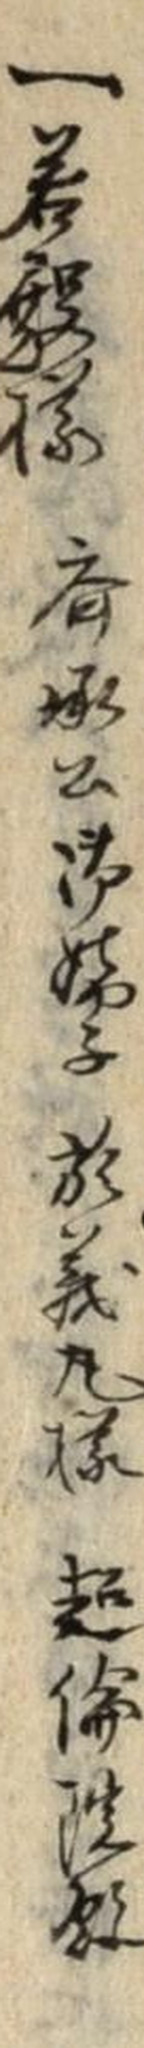一若殿様斉承公御嫡子於義丸様超倫院殿
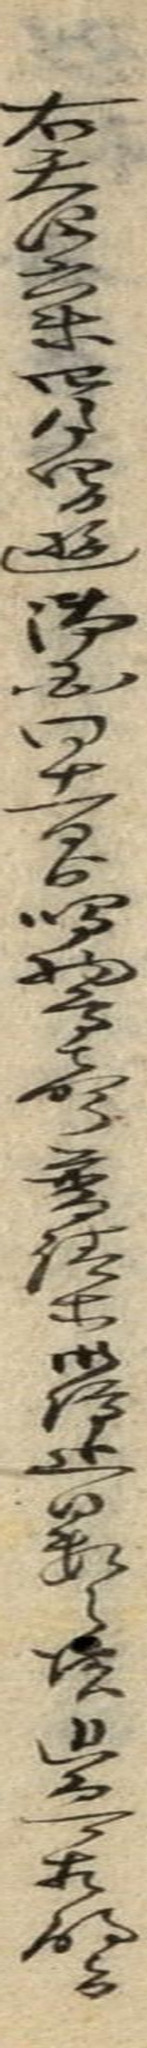右天保六未四月四日逝御国同十一日ゟ鳴物高声普請等御停止日数之儀は追て可相触旨
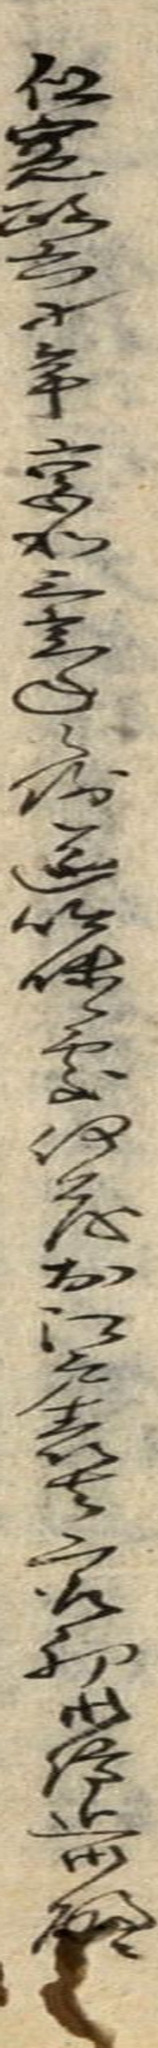但寛政六刁年享和三寅年之例遂吟味候処何も於江戸表は最初御停止御触に
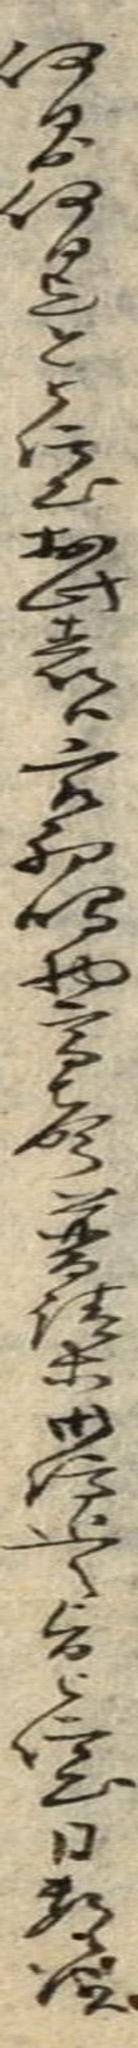何日ゟ何日迄と被仰出於此表は最初鳴物高声普請等御停止之旨被仰出日数之儀は
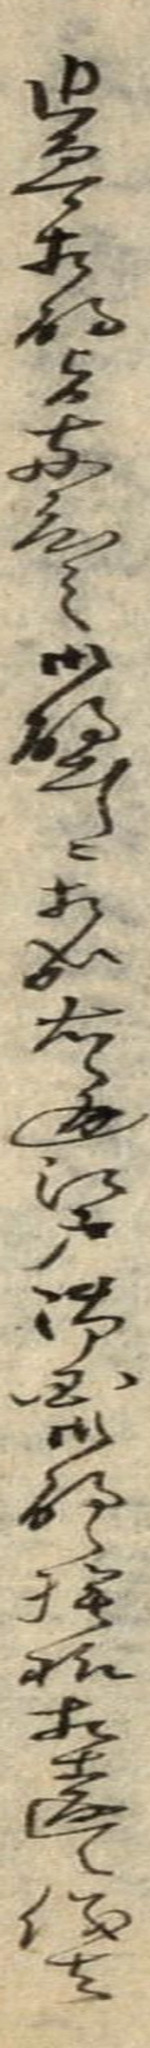追て可相触旨両度之御触出し被相成右之通江戸御国御触之模様相違候儀は
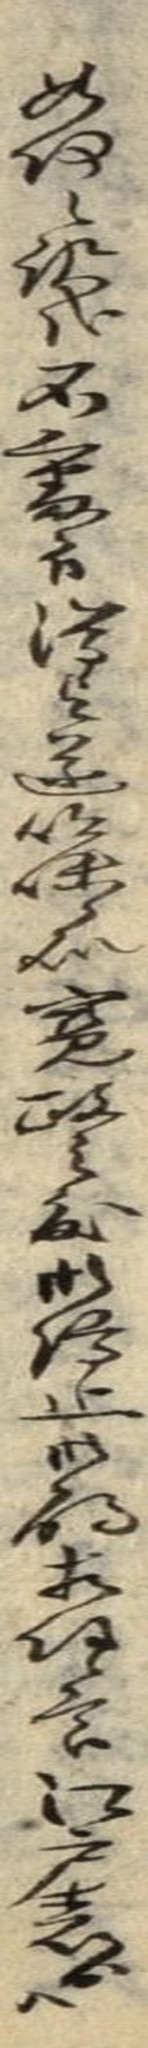如何之訳哉不審に付得と遂吟味候処寛政之度御停止御触相伺候節江戸表ゟは
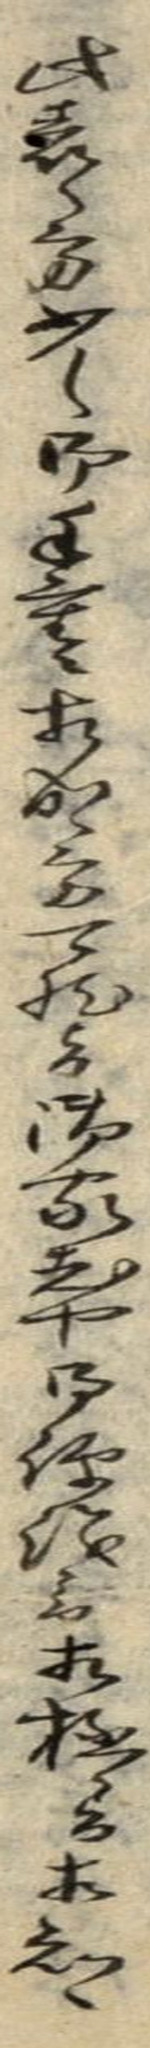此表之方少し御手重に相成候方可然旨御家老中御評議にて相極候旨相知候
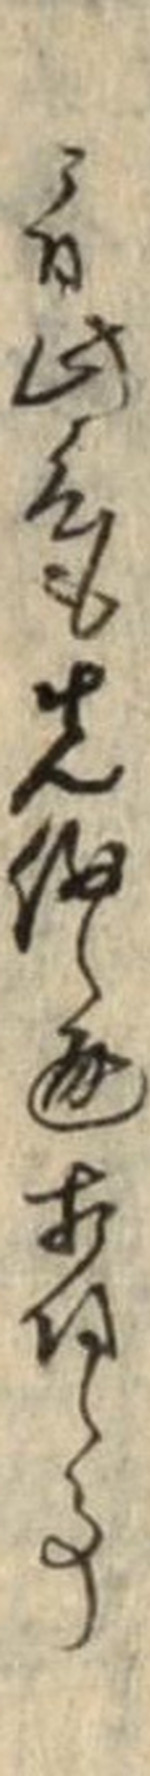に付此度も先例之通相伺候事

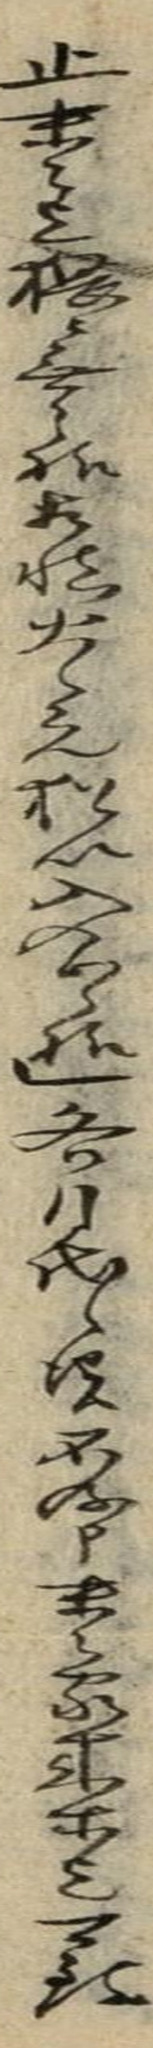止末々迄猥に無之様相慎火之元猶以入念候様」各月代之儀は不及申末々家来等迄可致
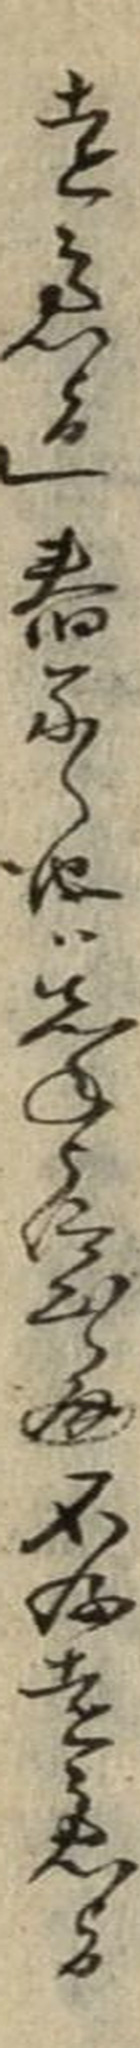遠慮旨」舂米之儀は先年被仰出候通不及遠慮旨
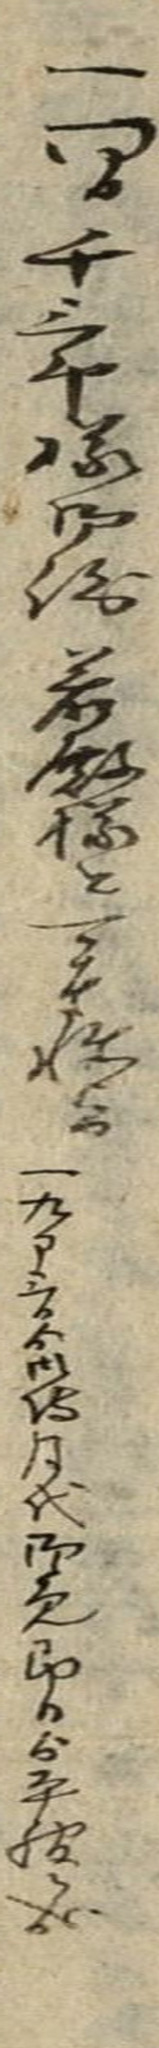一同日千三郎様御儀若殿様と可奉称旨一九月三日ゟ御侍月代御免即日ゟ平服に成
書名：御停止異変死失
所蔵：福井県文書館 Fukui Prefectural Archives
